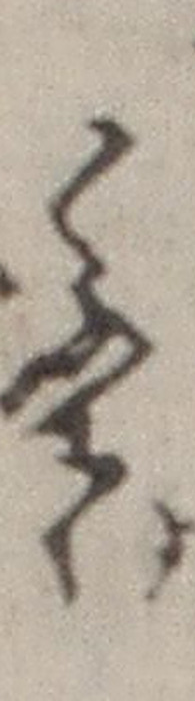くふて
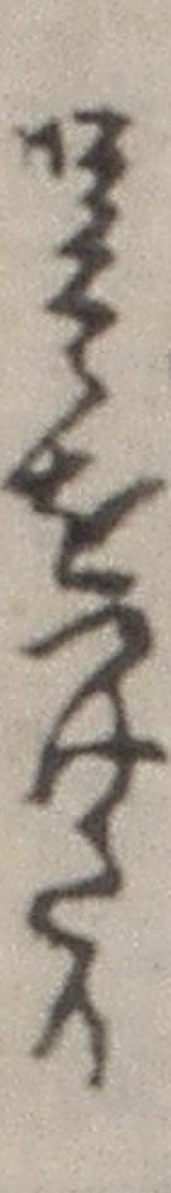味そをつけたり

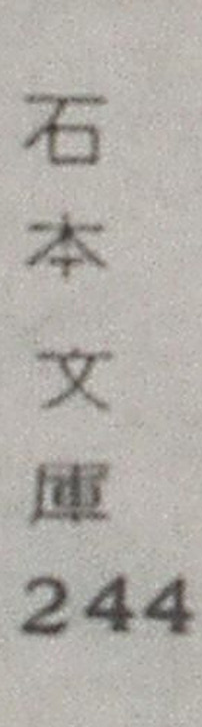石本文庫
